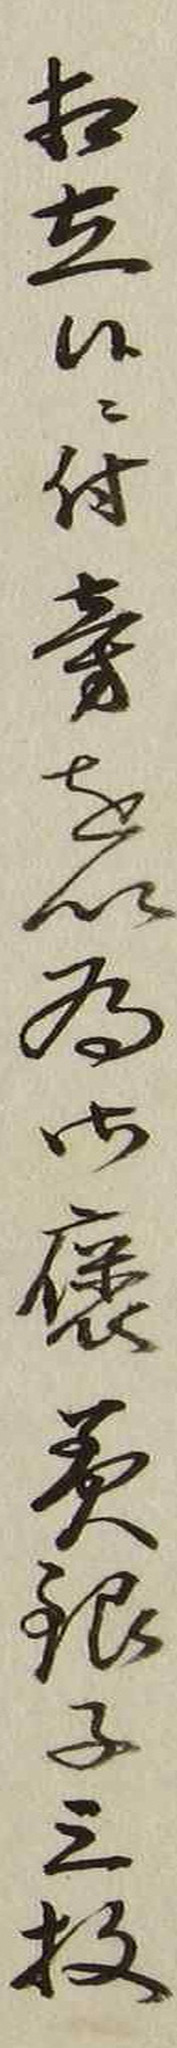相立候ニ付旁を以為御褒美銀子三枚
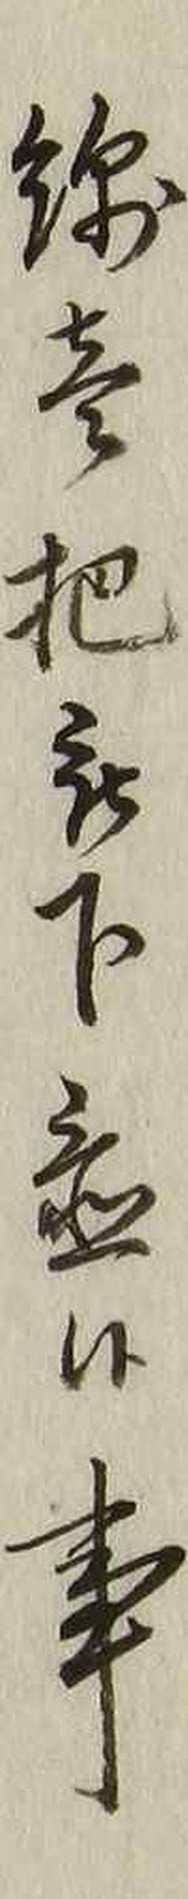綿壱把被下置候事
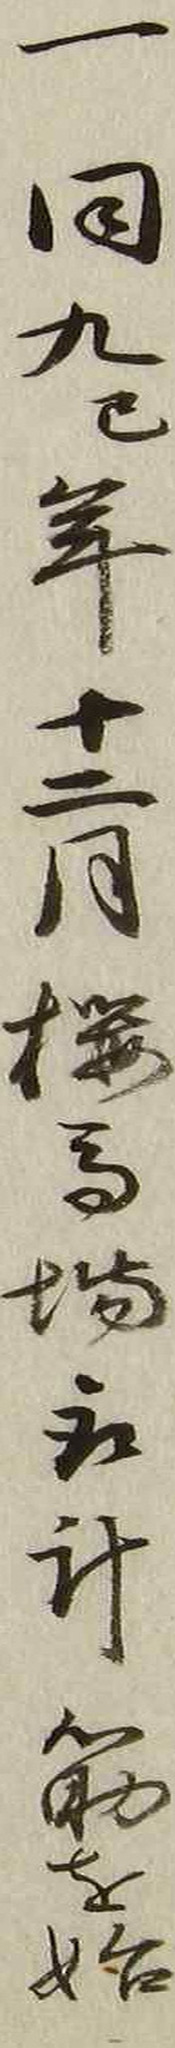一同九巳年十二月櫻馬場取計筋を始
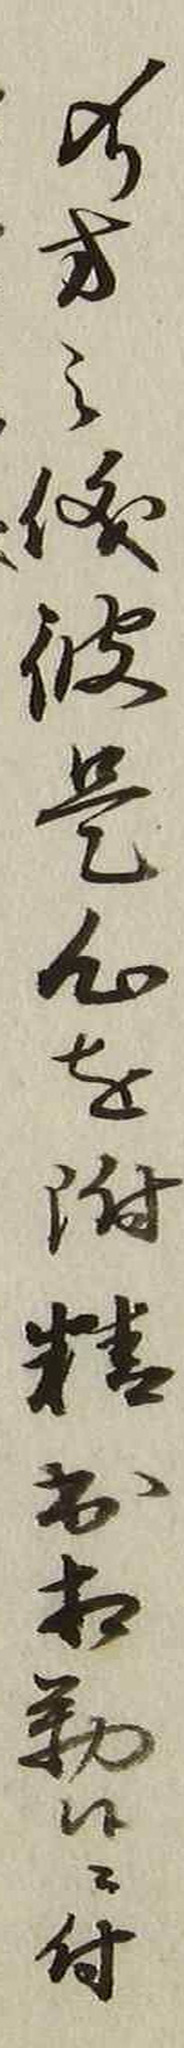〆り方之儀彼是心を附精出相勤候ニ付
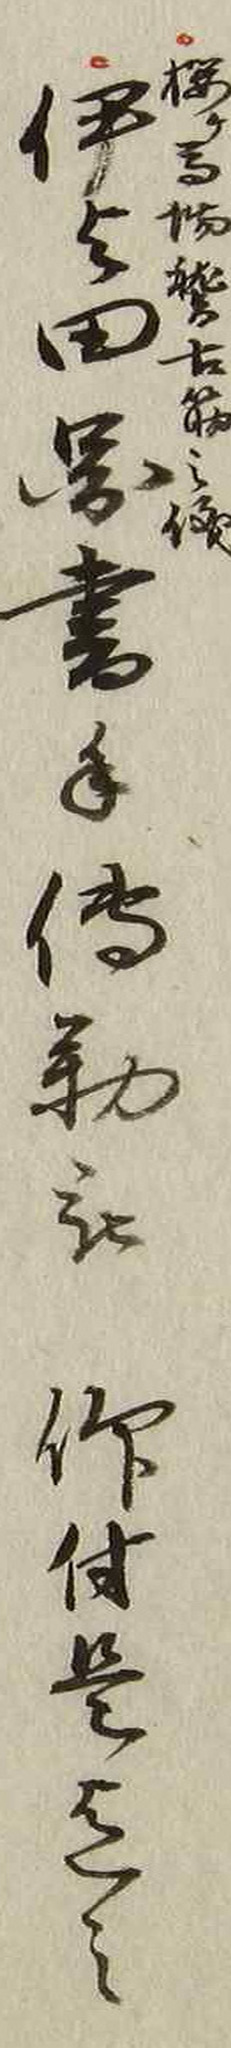伊与田図書手伝勤被仰付是迄之
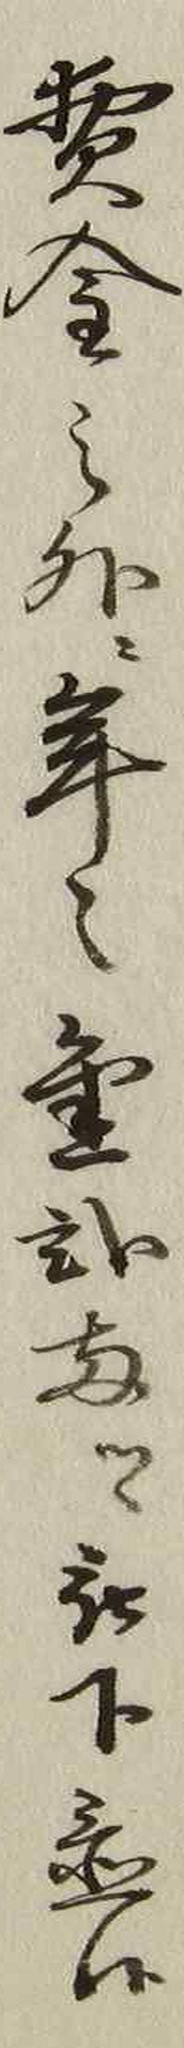費金之外ニ年々金弐両ツヽ被下置候
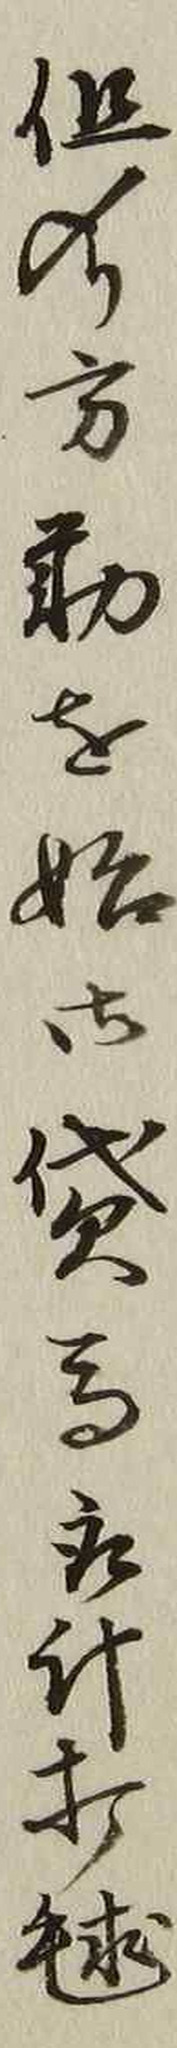但〆り方勤を始御貸馬取計打毬
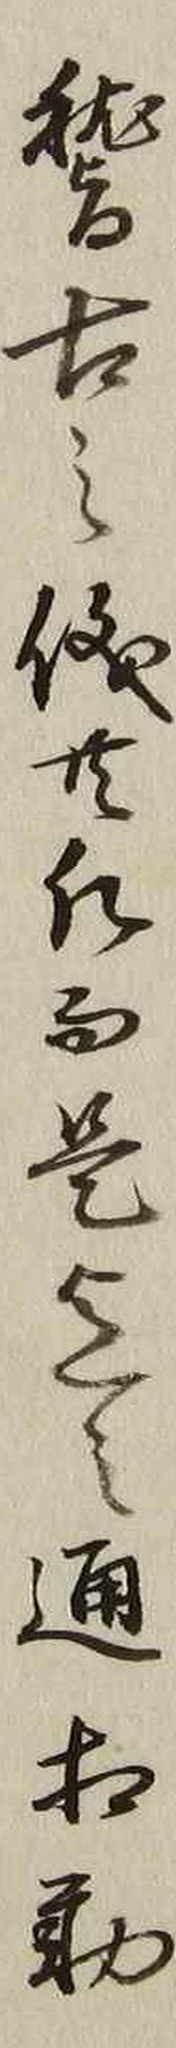稽古之儀共凡而是迄之通相勤
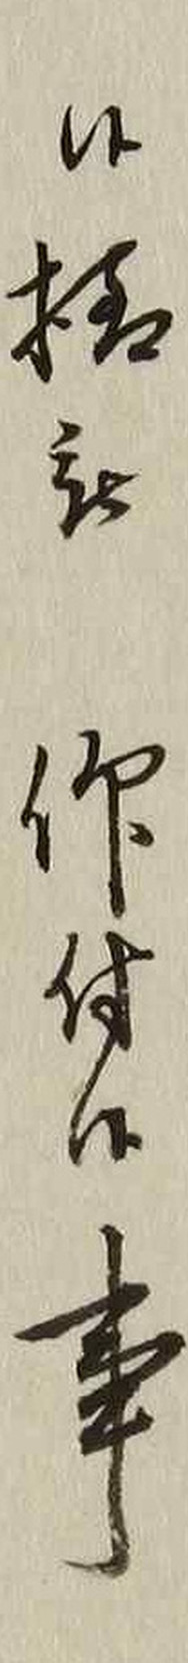候様被仰付候事
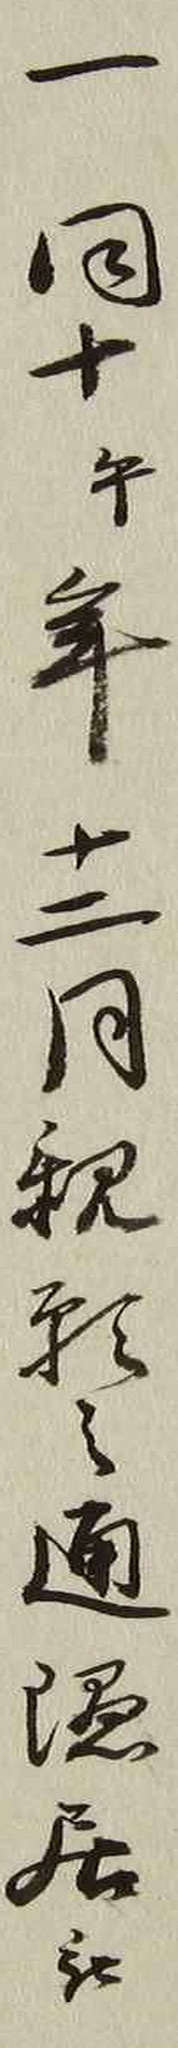一同十午年十二月親願之通隠居被
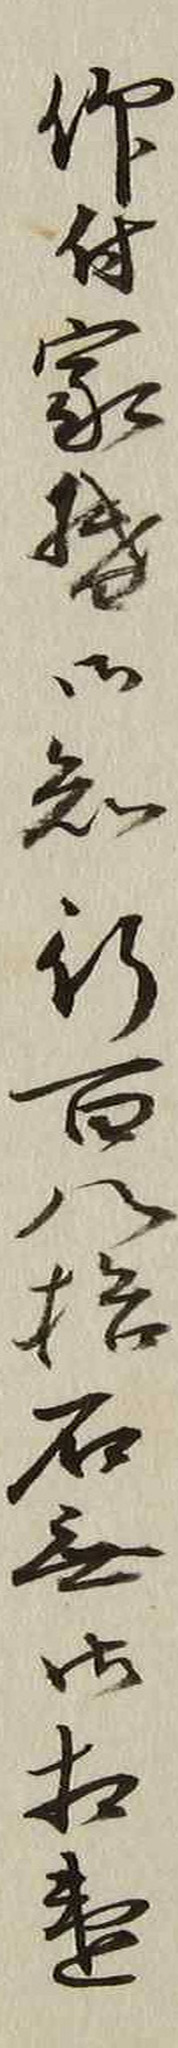仰付家督御知行百八十石無御相違
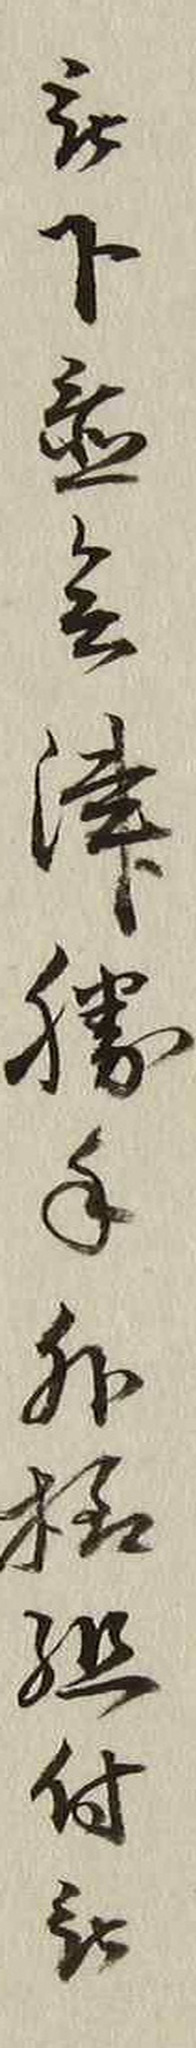被下置会津勝手外様組付被
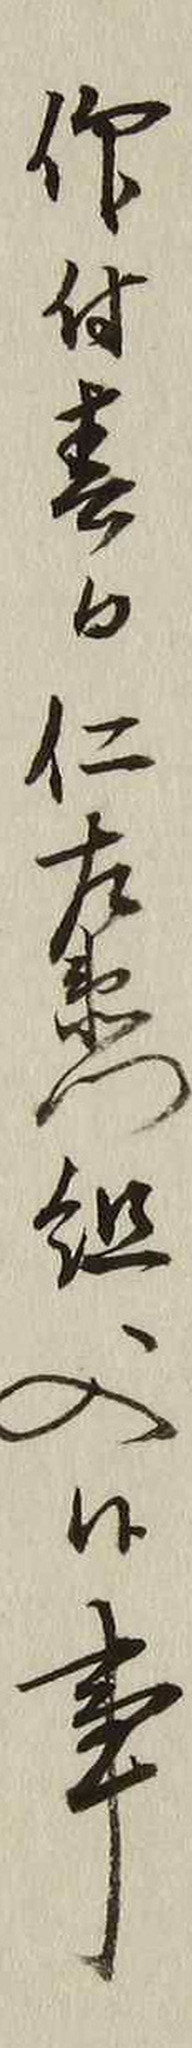仰付青日仁左衛門組へ入候事
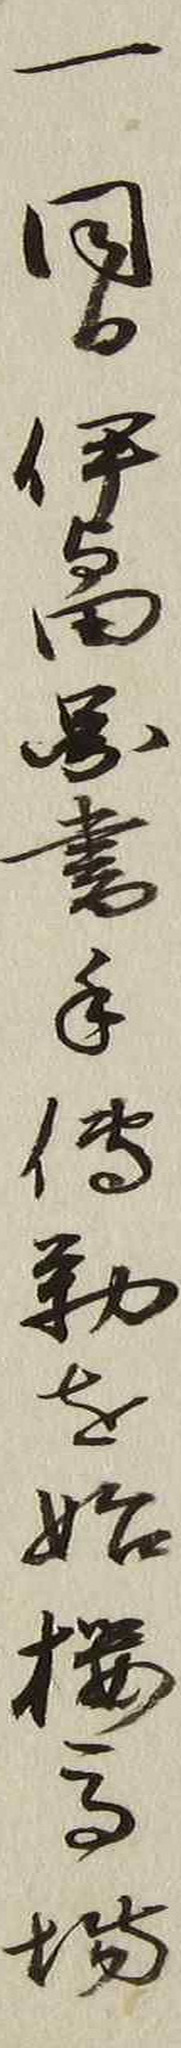一同日伊与田図書手伝勤を始櫻馬場
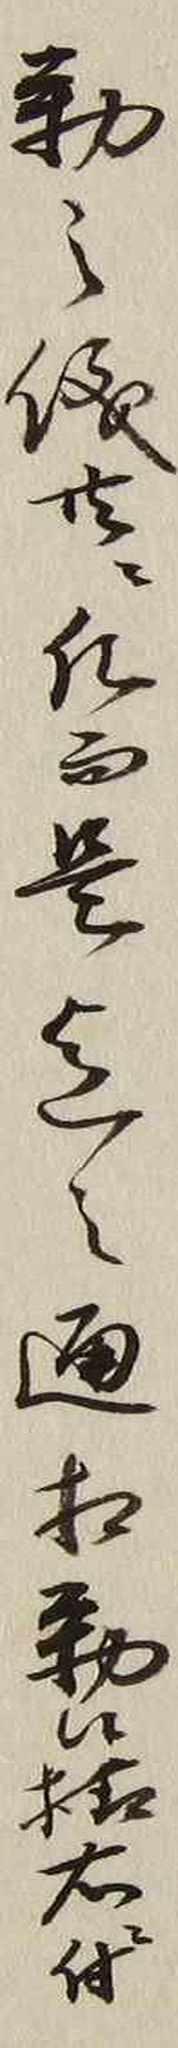勤之儀共ニ凡而是迄之通相勤候様右ニ付
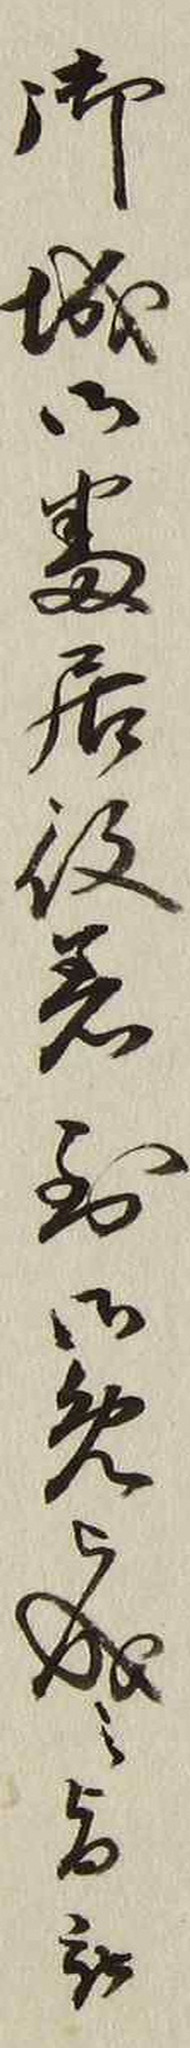御城御番居役着到御免被成之旨被
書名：諸士系譜　巻之160　な之部2
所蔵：会津若松市立会津図書館
